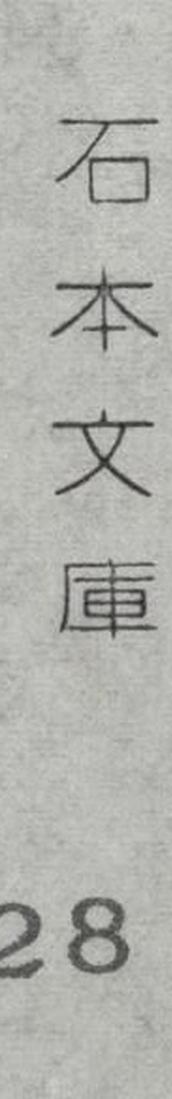石本文庫
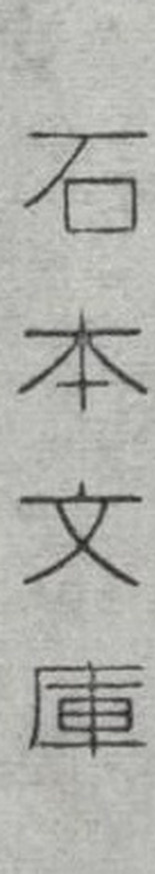石本文庫

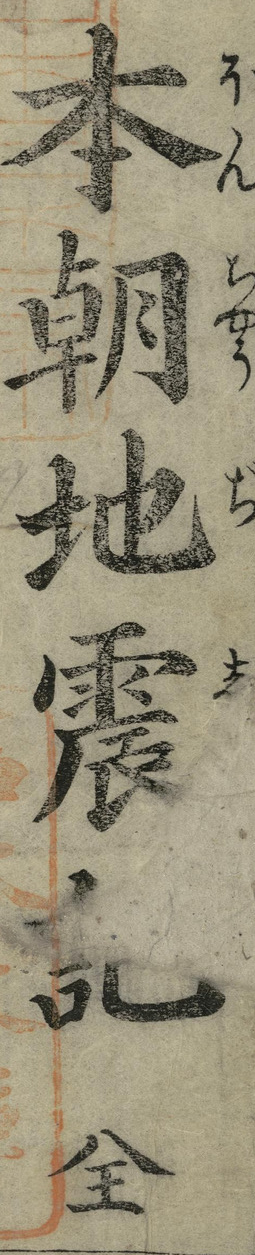本朝地震記全
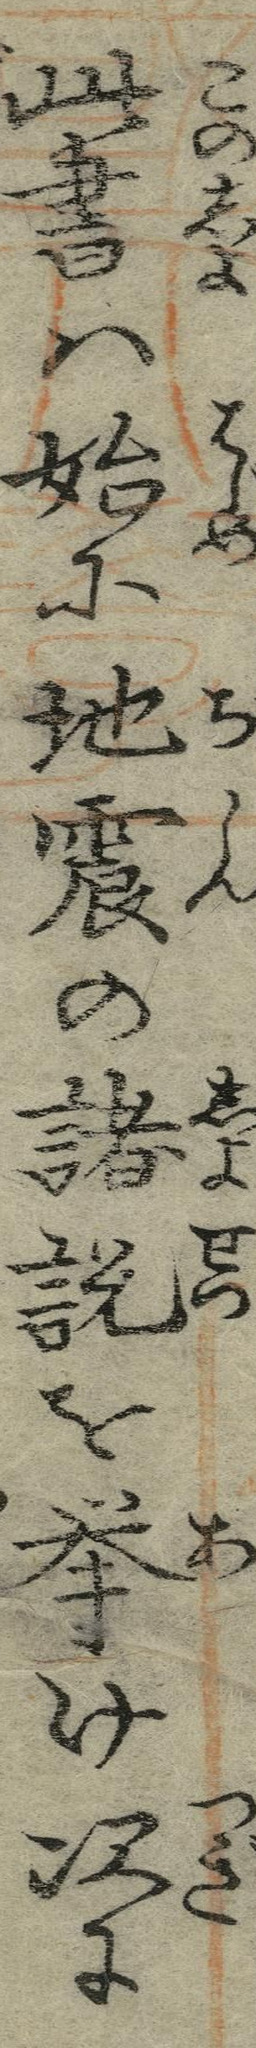此書は始に地震の諸説を挙け次に
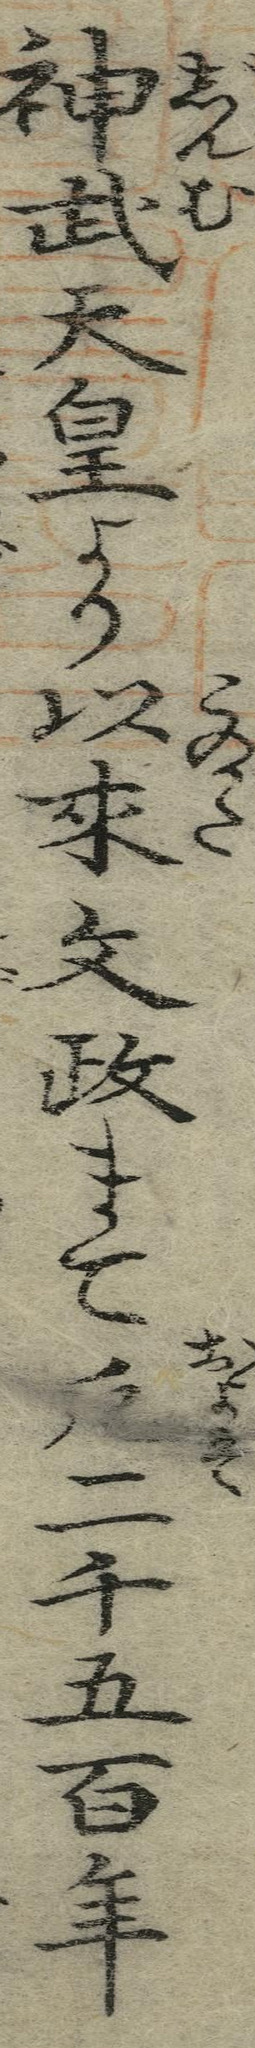神武天皇より以来文政まて凡二千五百年
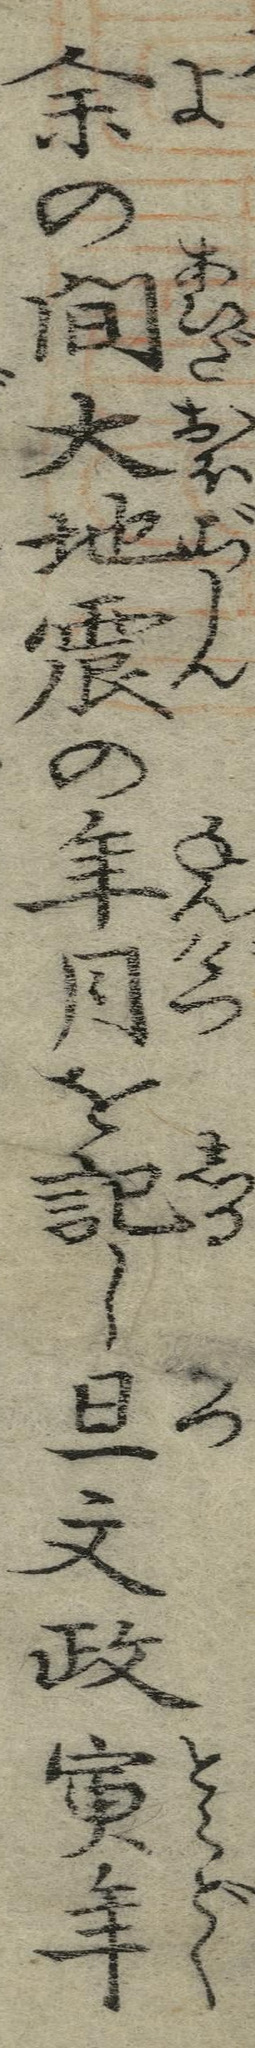余の間大地震の年月を記し且文政寅年
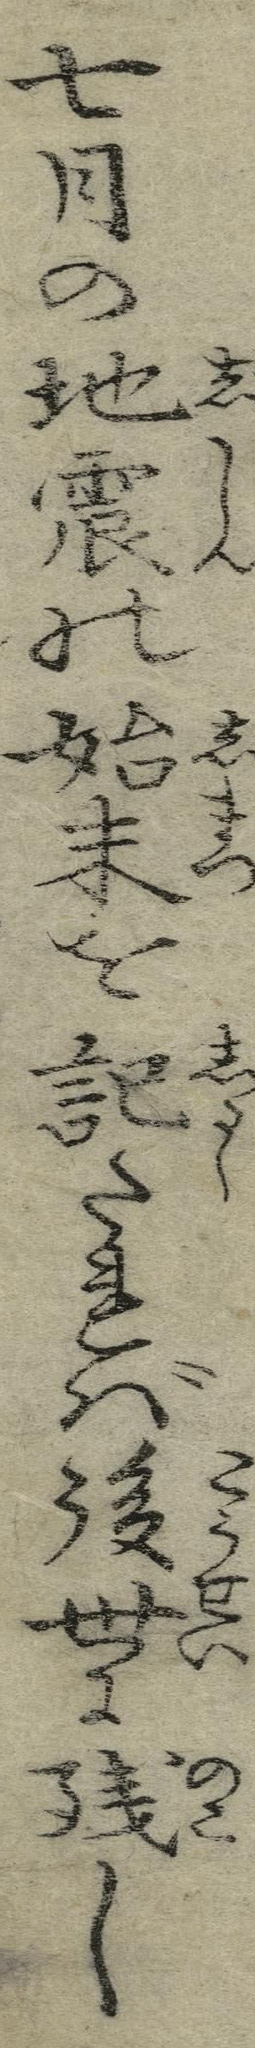七月の地震の始末を記たれば後世に残し
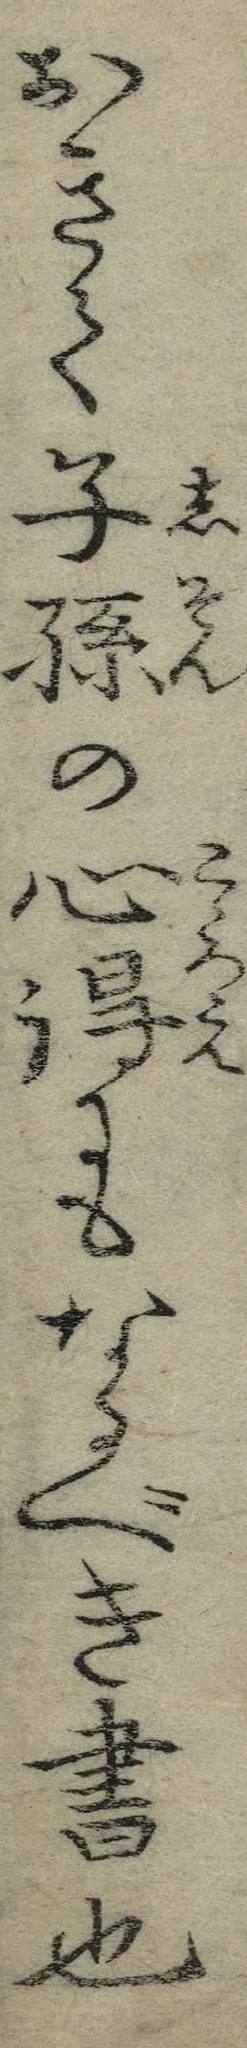おきて子孫の心得にもなるべき書也
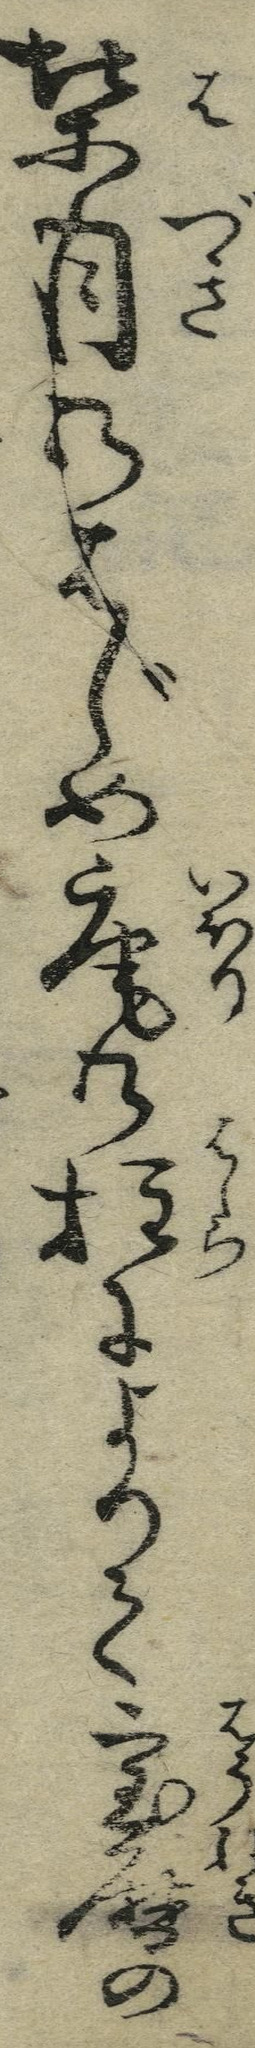葉月のはじめ庵の柱によりて宝暦の
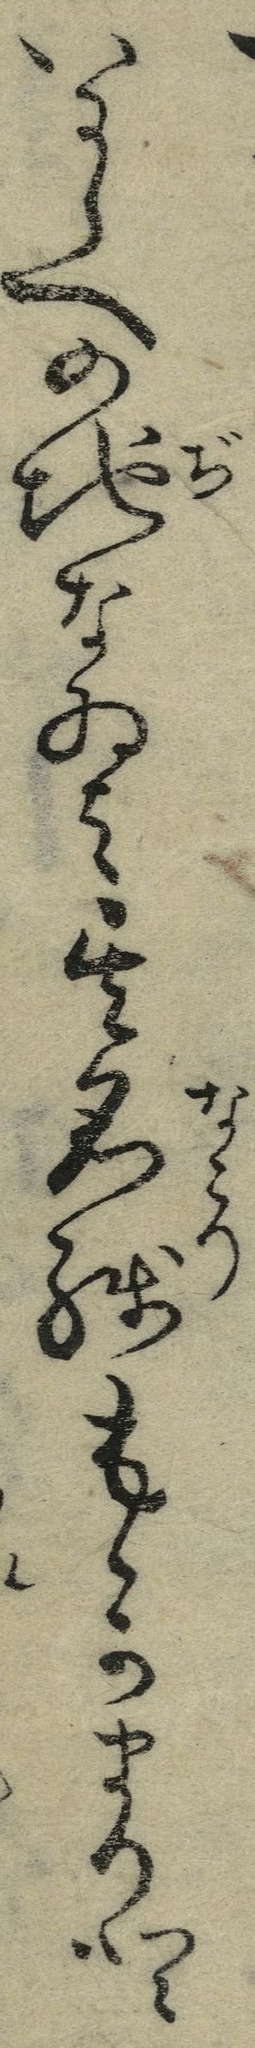いにしへの地なゐは其名残もゝかまりと
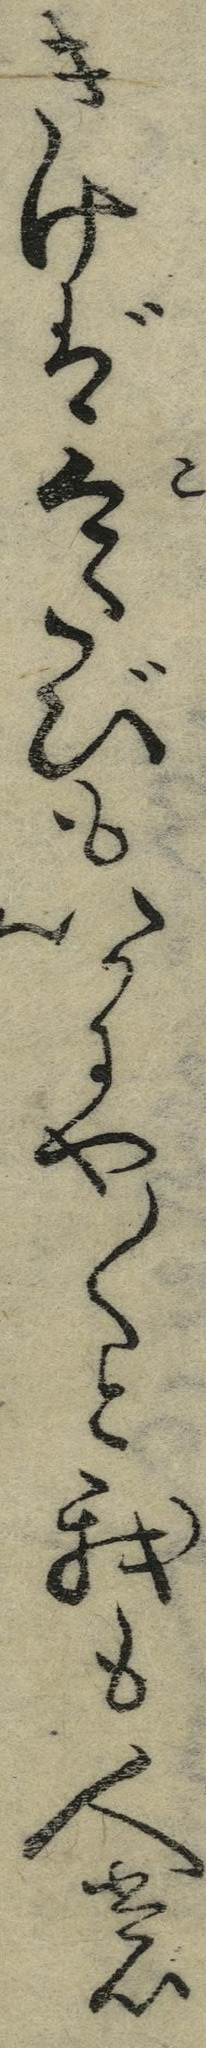きけば今たびもいかにや〳〵と我も人も
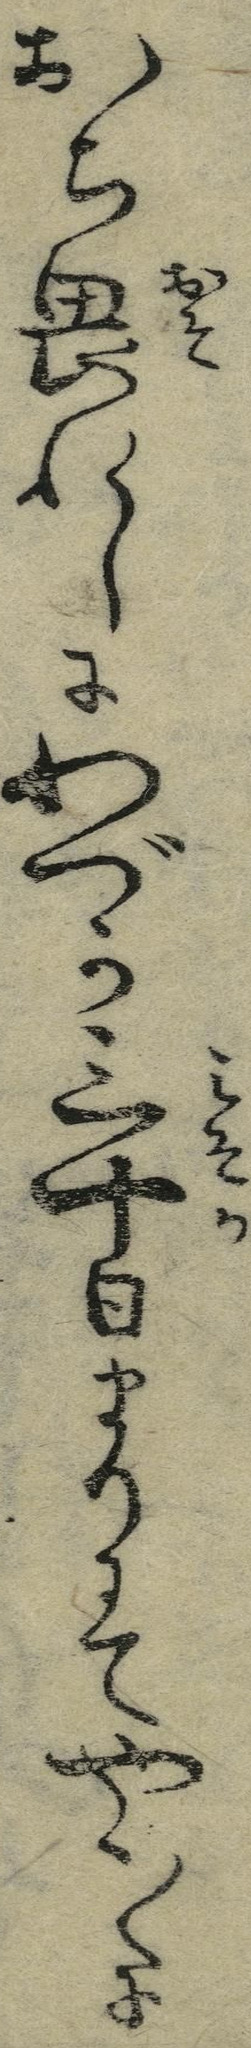おち畏れしにわづか三十日まりにてやく〳〵に
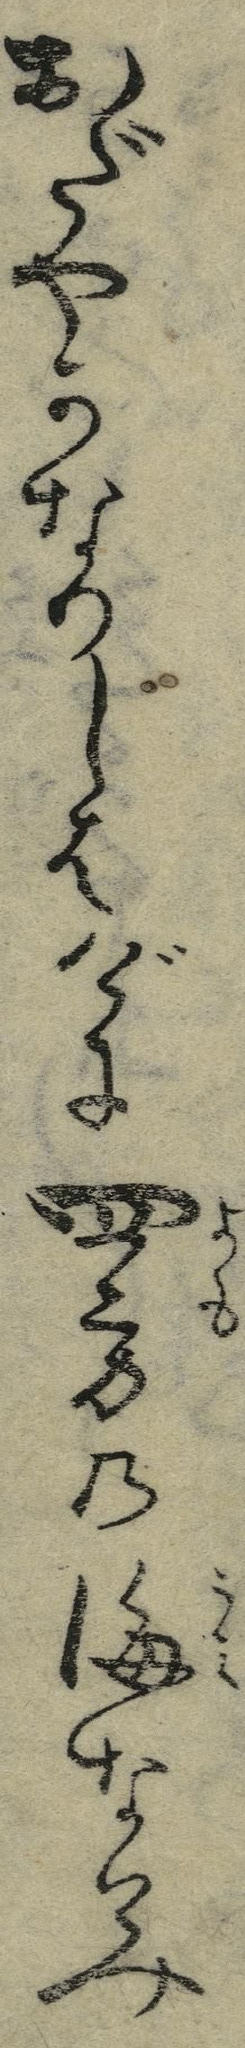おだやかなりしはげに四方の海なみ
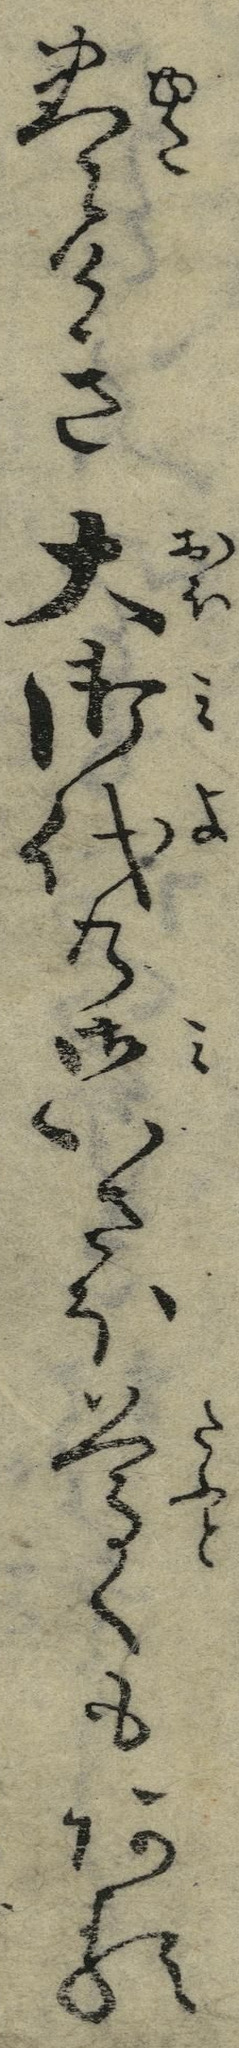豊けき大御代の御いさほ尊くもある
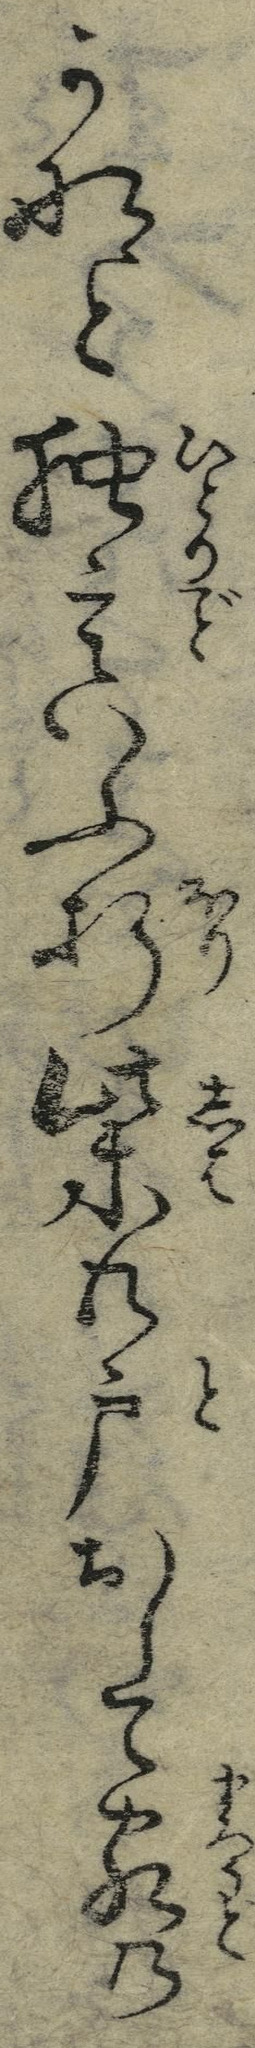かなと独言いふ折柴の戸おして客の

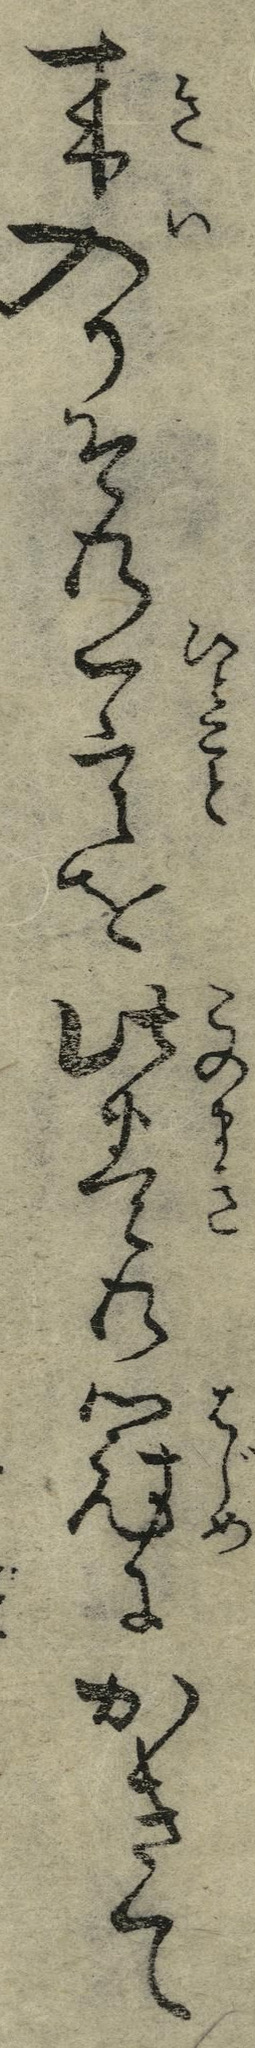来入りその一言を此巻の冠にかきて
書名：本朝地震記　全
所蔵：東京大学地震研究所図書室 Earthquake Research Institute Library, The University of Tokyo, JAPAN
